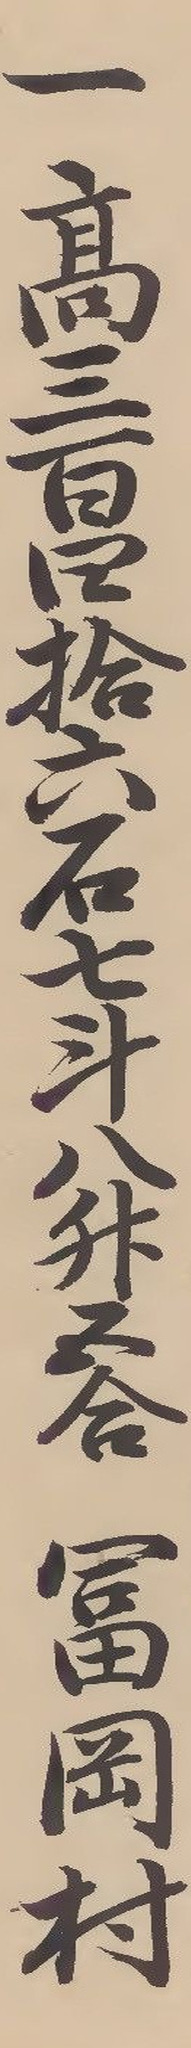一高三百四拾六石七斗八升五合富岡村

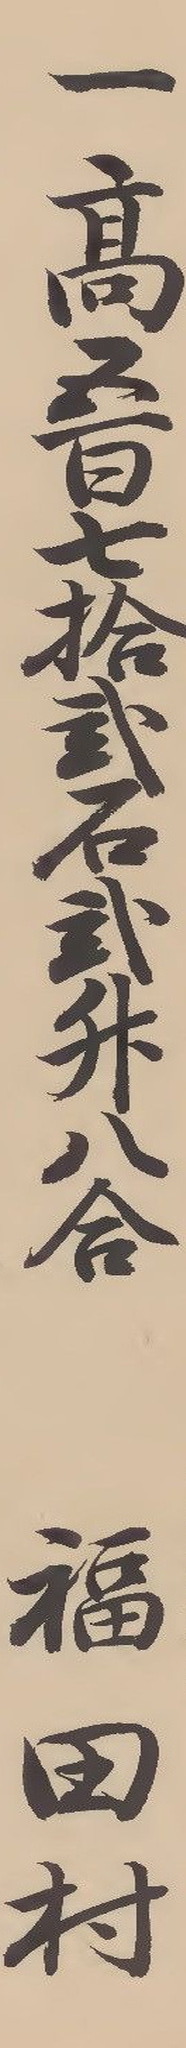一高五百七拾弐石弐升八合福田村
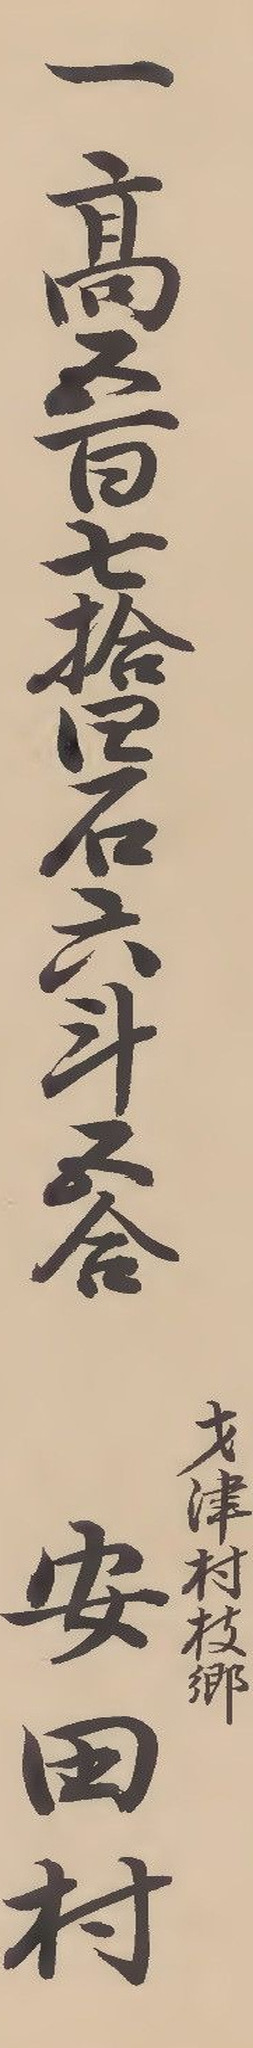一高五百七拾四石六斗五合安田村
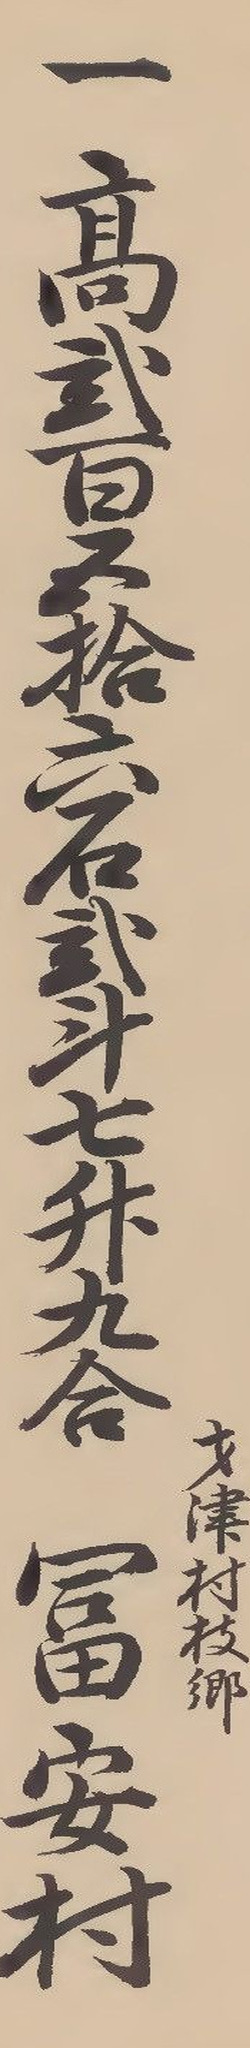一高弐百五拾六石弐斗七升九合富安村
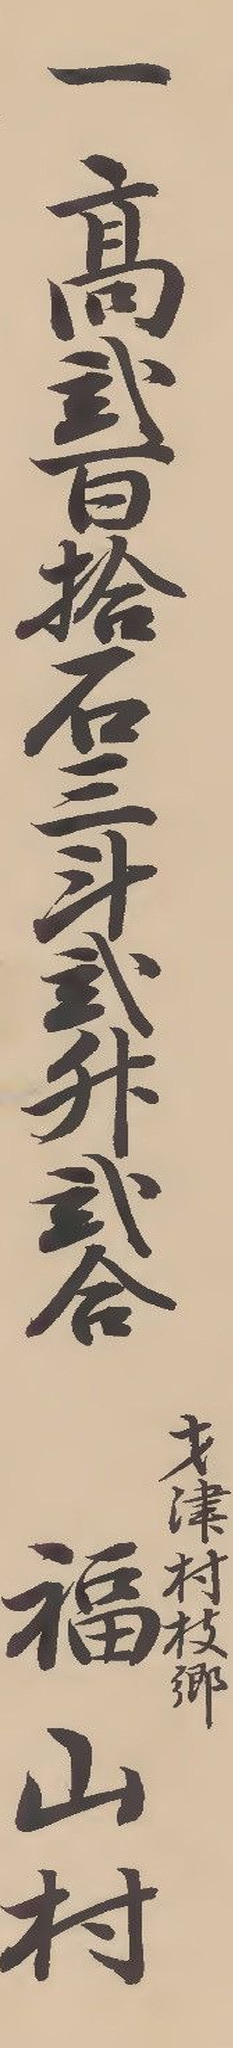一高弐百拾石三斗弐升弐合福山村
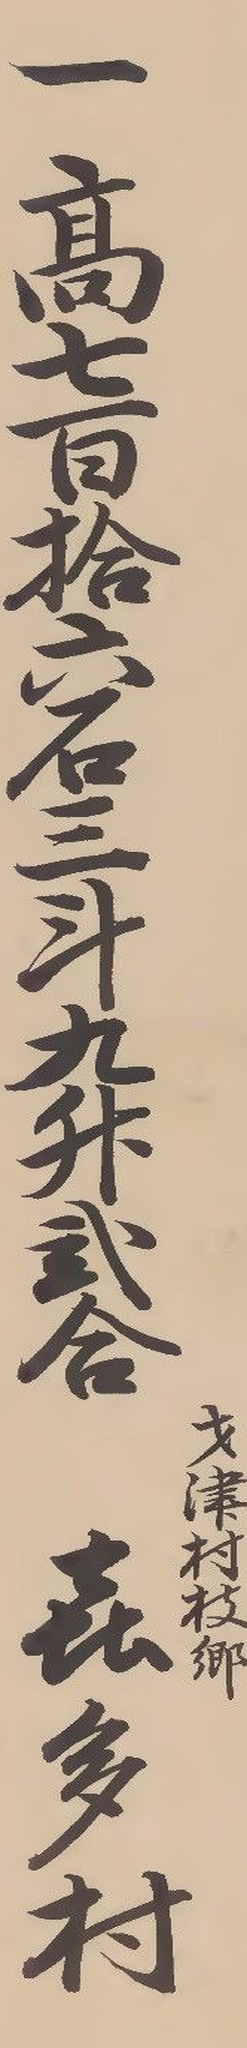一高七百拾六石三斗九升弐合喜多村
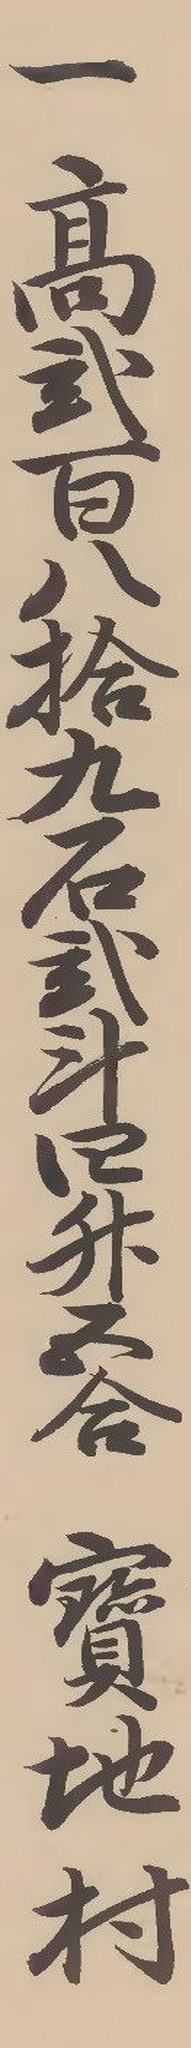一高弐百八拾九石弐斗四升五合宝地村
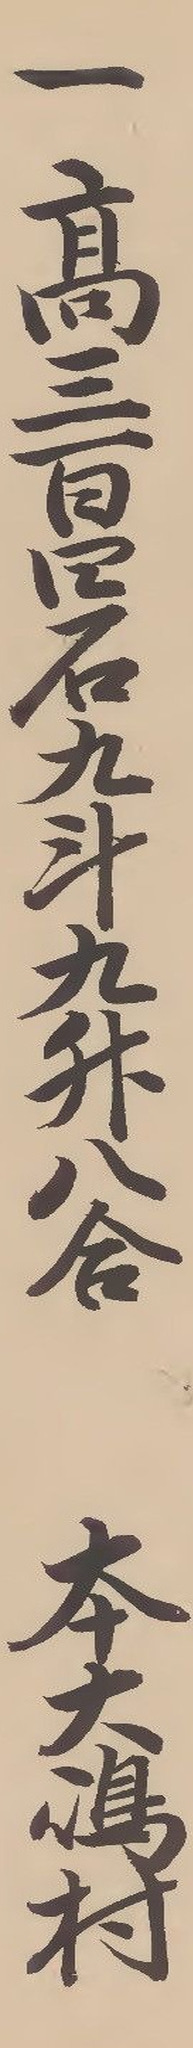一高三百四石九斗九升八合本大島村
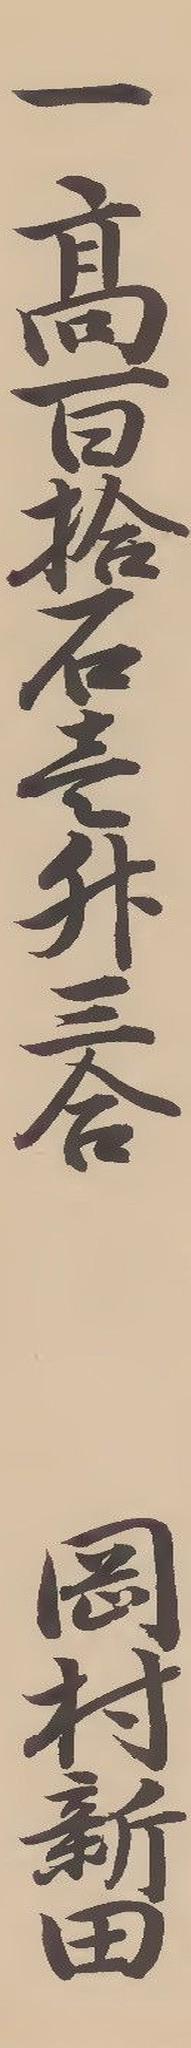一高百拾石壱升三合岡村新田

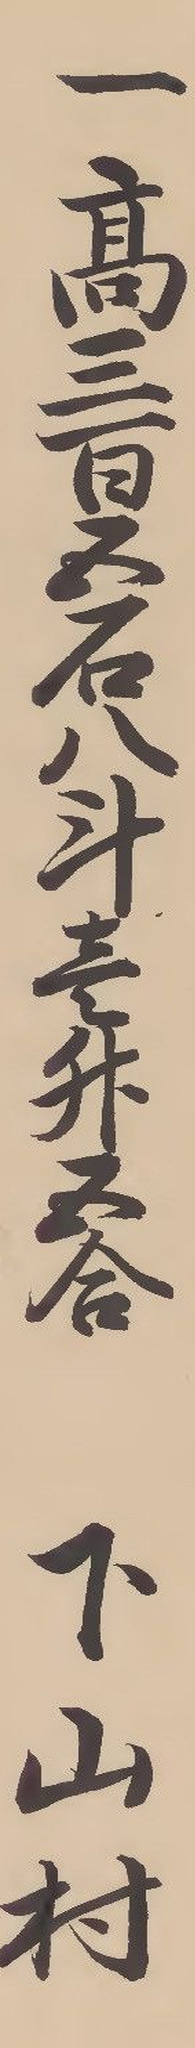一高三百五石八斗壱升五合下山村
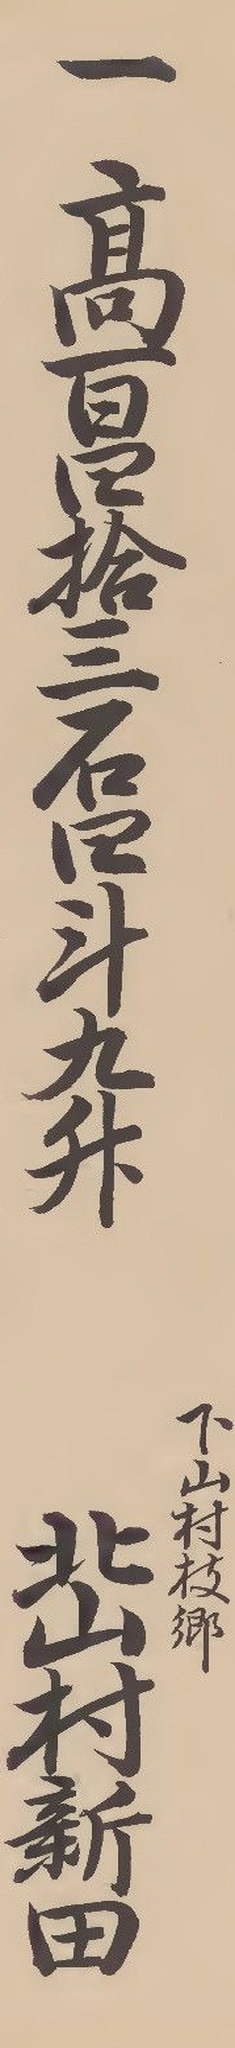一高百四拾三石四斗九升北山村新田
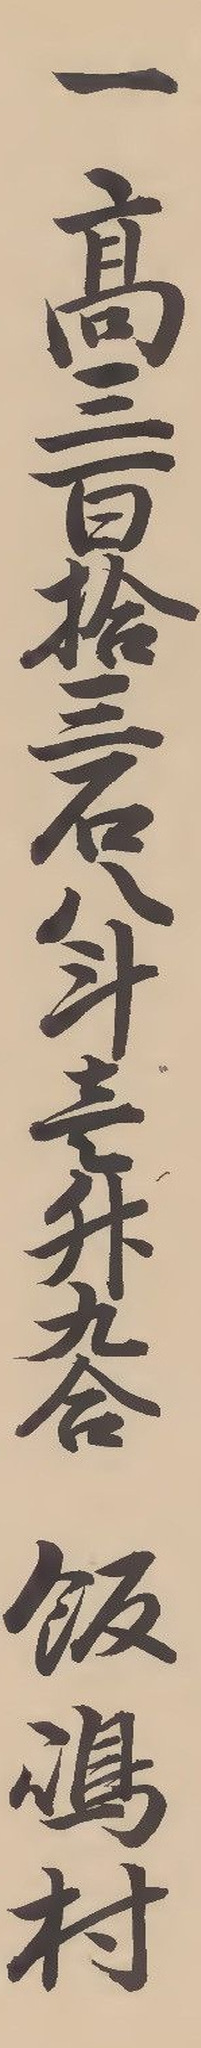一高三百拾三石八斗壱升九合飯島村
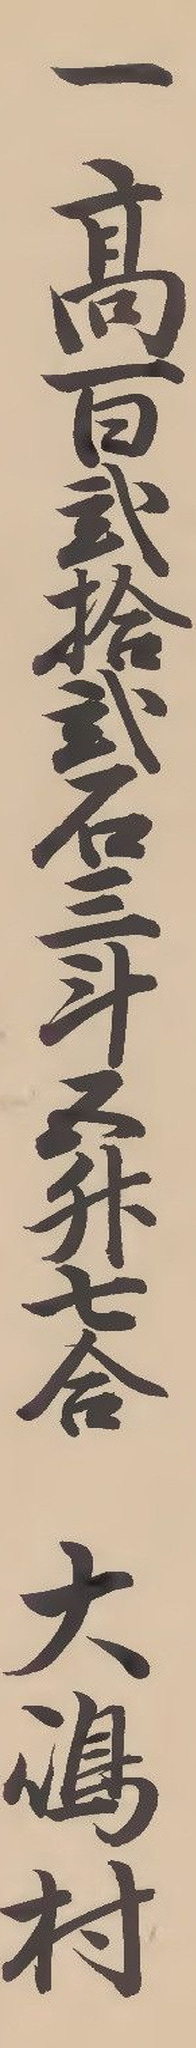一高百弐拾弐石三斗五升七合大島村
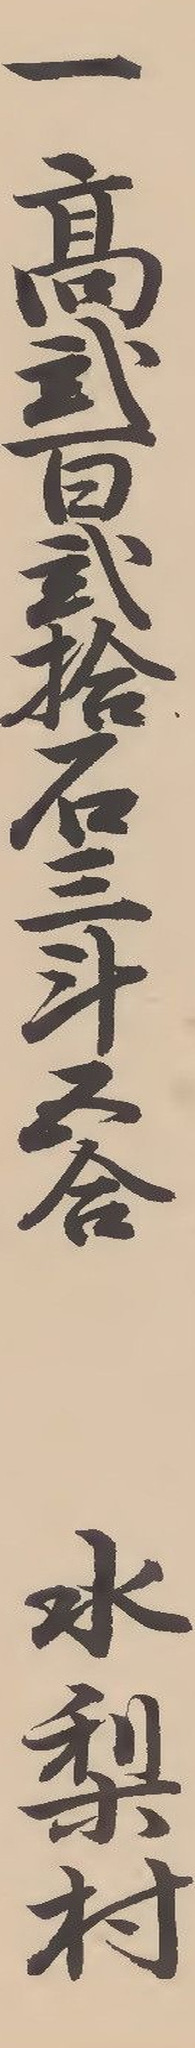一高弐百弐拾石三斗五合水梨村
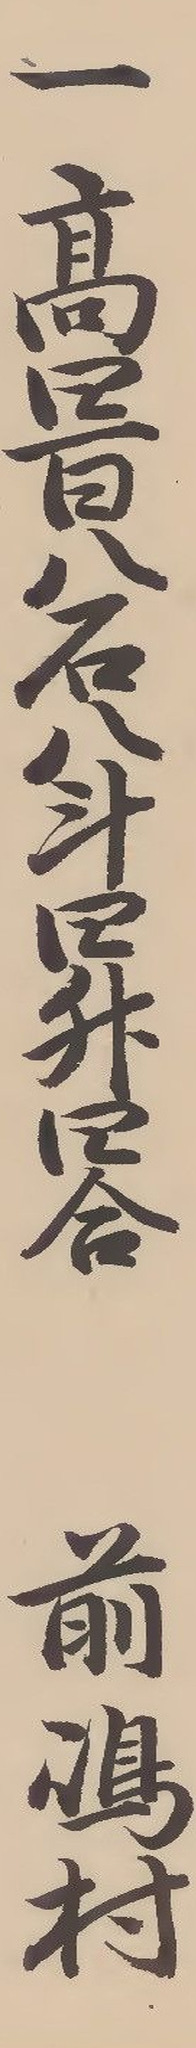一高四百八石八斗四升四合前島村
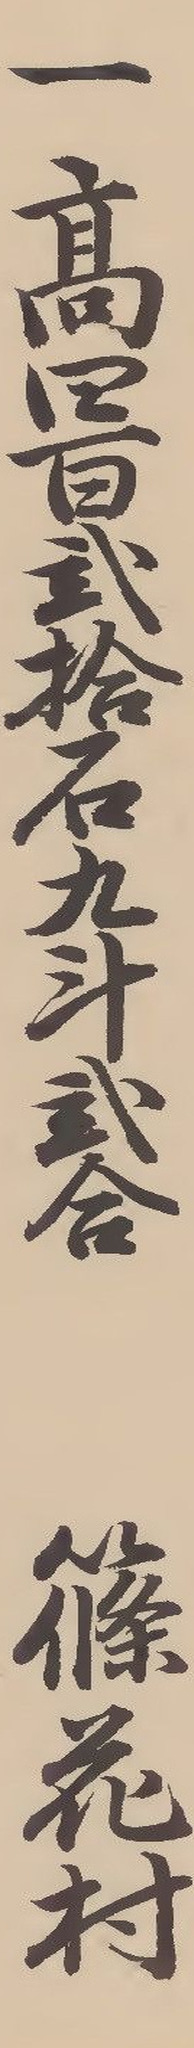一高四百弐拾石九斗弐合篠花村
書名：越後国郷帳　中
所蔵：国立公文書館 National Archives of Japan
